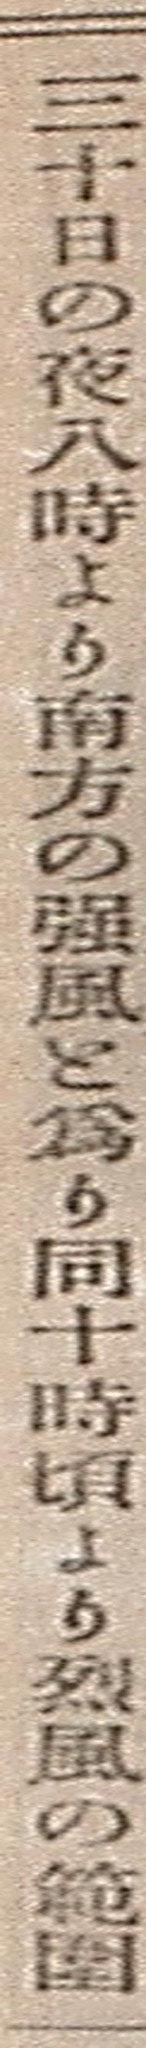三十日の夜八時より南方の強風と為り同十時頃より烈風の範囲
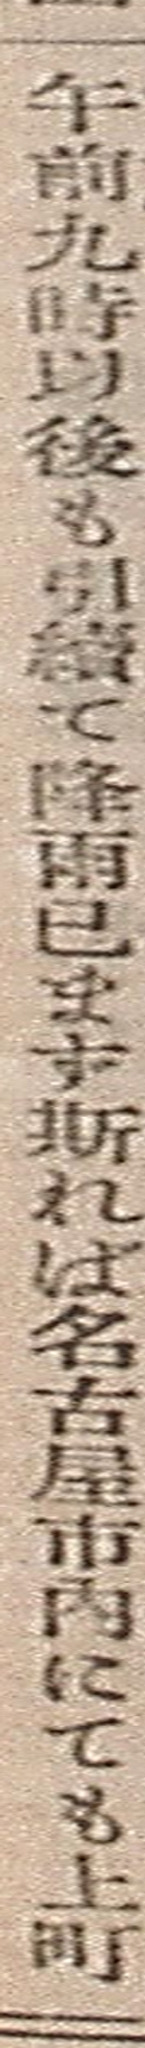午前九時以後も引続て降雨已まず斯れば名古屋市内にても上町

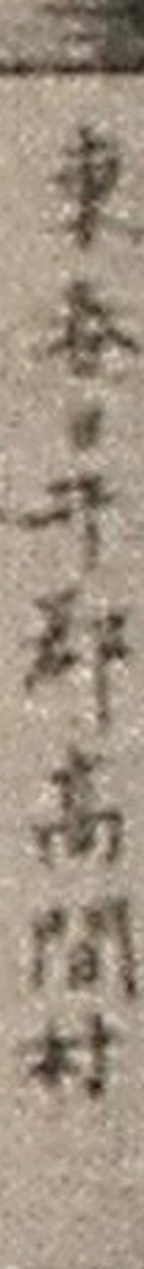東春日井郡高間村

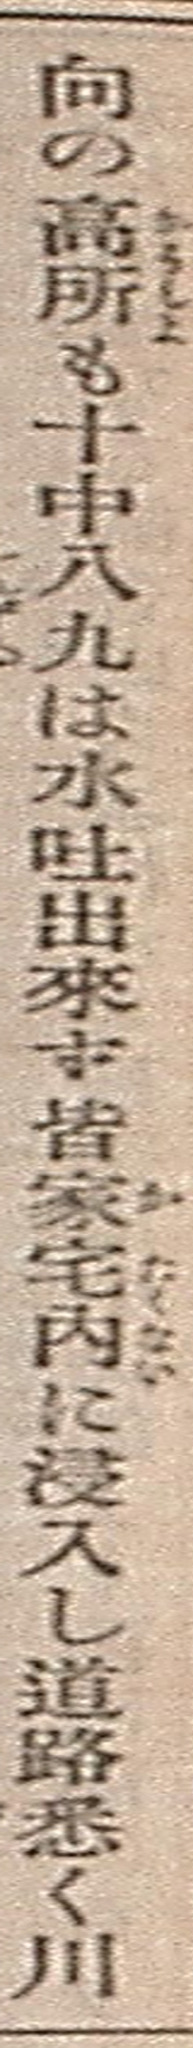向の高所も十中八九は水吐出来ず皆家宅内に浸入し道路悉く川
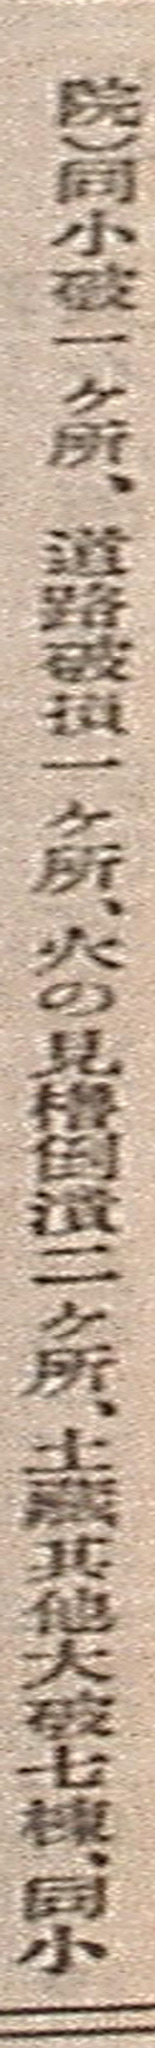院）同小破一ヶ所、道路破損一ヶ所、火の見櫓倒潰二ヶ所、土蔵其他大破七棟、同小
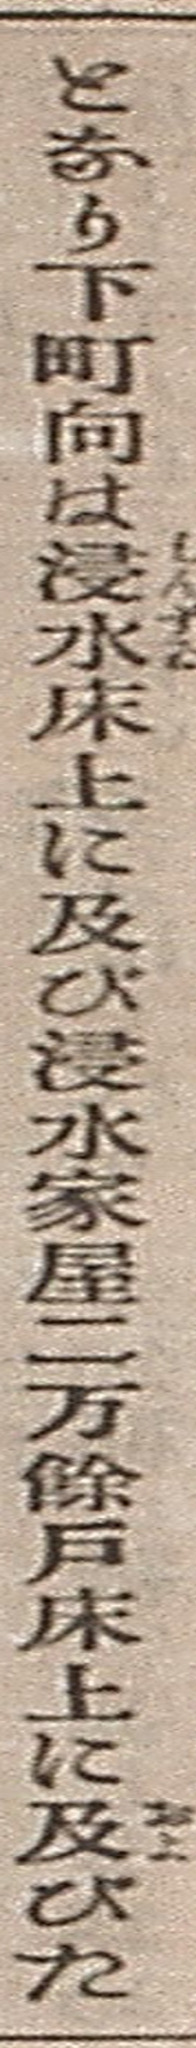となり下町向は浸水床上に及び浸水家屋二万餘戸床上に及びた
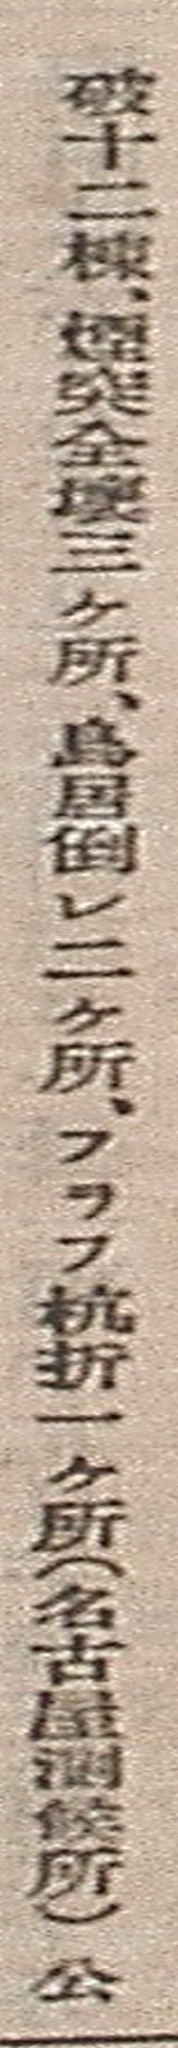破十二棟、煙突全壊三ヶ所、鳥居倒レ二ヶ所、フヲフ杭折一ヶ所公
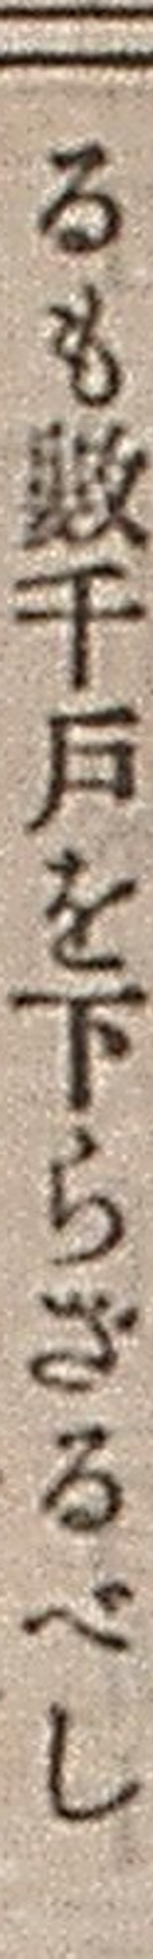るも数千戸を下らざるべし
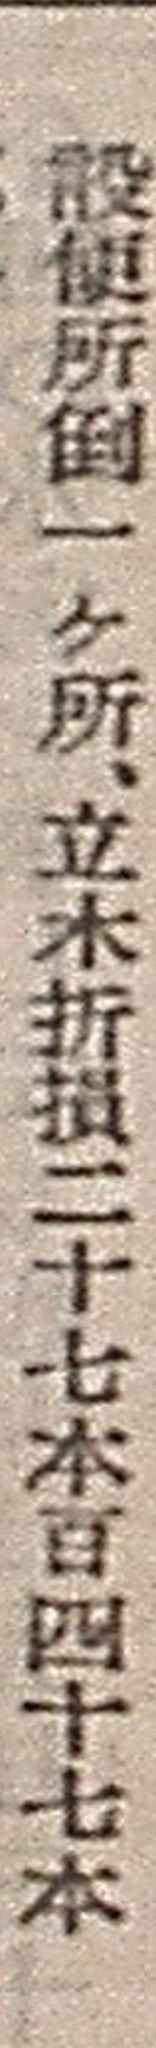設便所倒一ヶ所、立木折損二十七本百四十七本
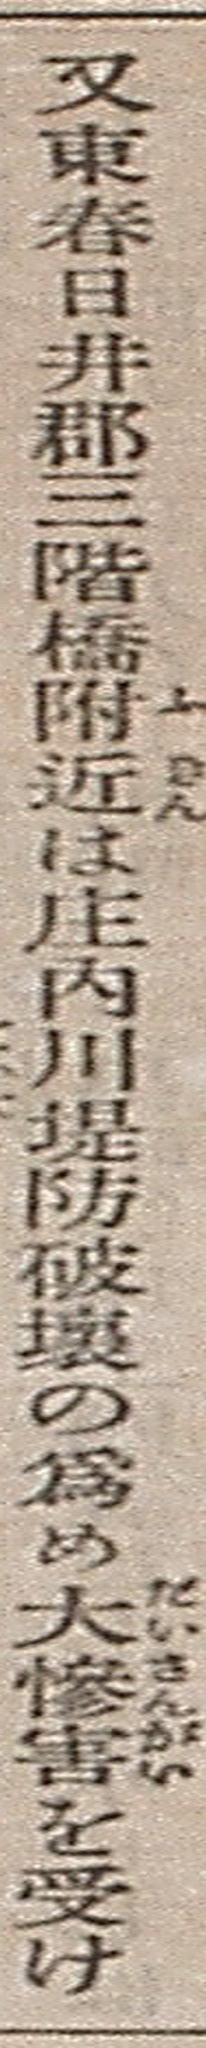又東春日井郡三階橋附近は庄内川堤防破壊の為め大惨害を受け
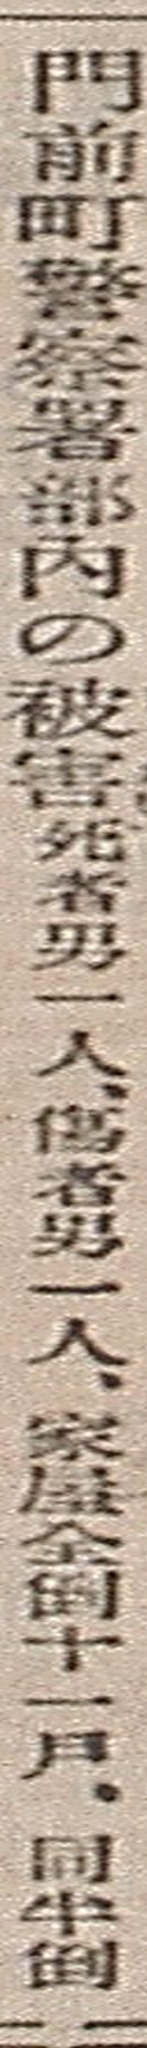門前町警察署部内の被害死者男一人、傷者男一人、家屋全倒十一戸、同半倒
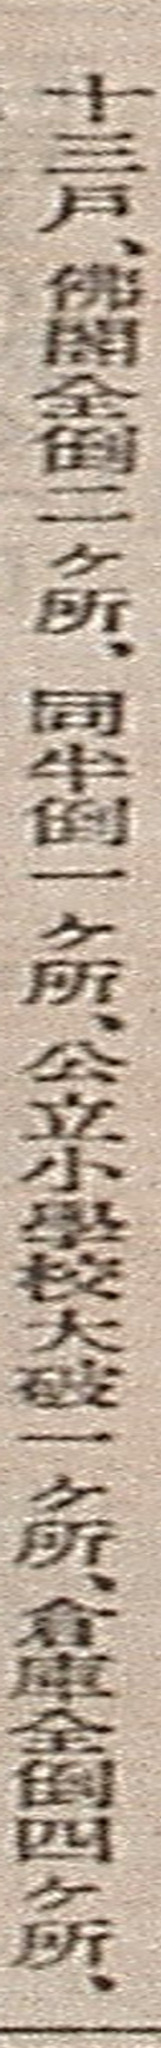十三戸、仏閣全倒二ヶ所、同半倒一ヶ所、公立小学校大破一ヶ所、倉庫全倒四ヶ所、
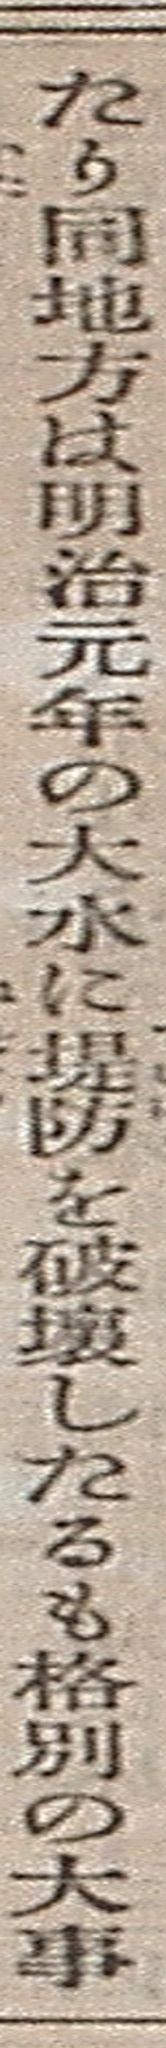たり同地方は明治元年の大水に堤防を破壊したるも格別の大事
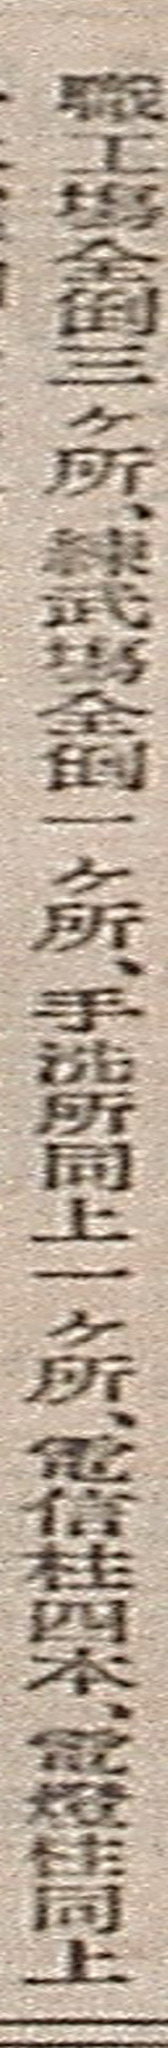職工場全倒三ヶ所、錬武場全倒一ヶ所、手洗所同上一ヶ所、電信柱四本同上
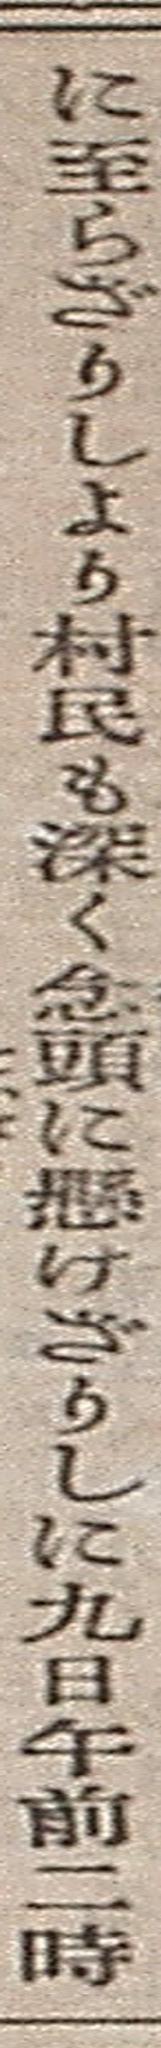に至らざりしより村民も深く念頭に懸けざりしに九日午前二時
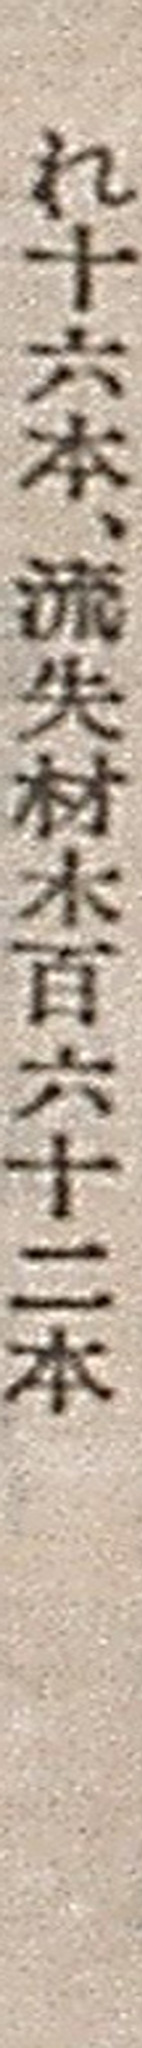れ十六本、流失材木百六十二本
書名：風俗畫報臨時増刊第百二十六號　洪水被害録（中）
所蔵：東京大学地震研究所図書室 Earthquake Research Institute Library, The University of Tokyo, JAPAN
